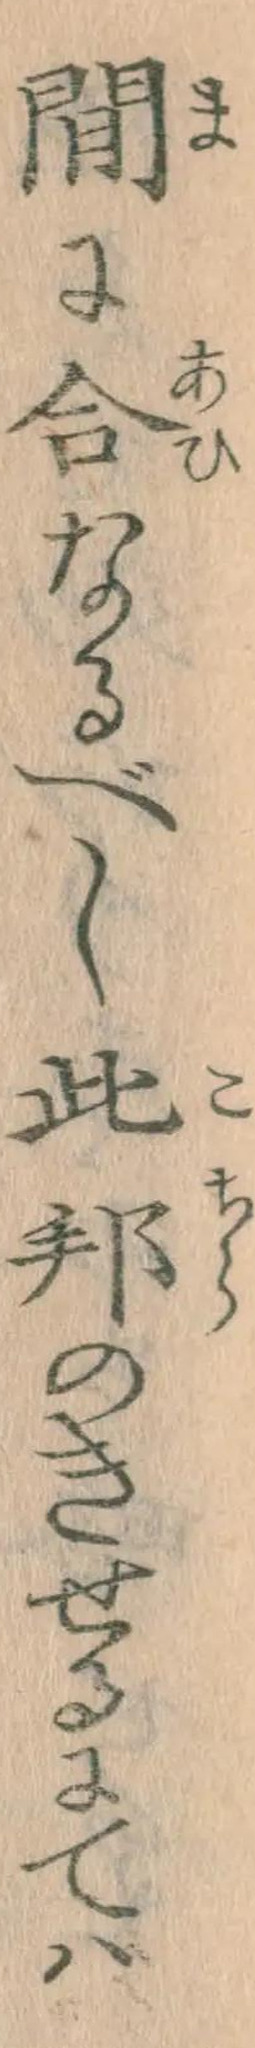間に合なるべし此邦のきせるにては
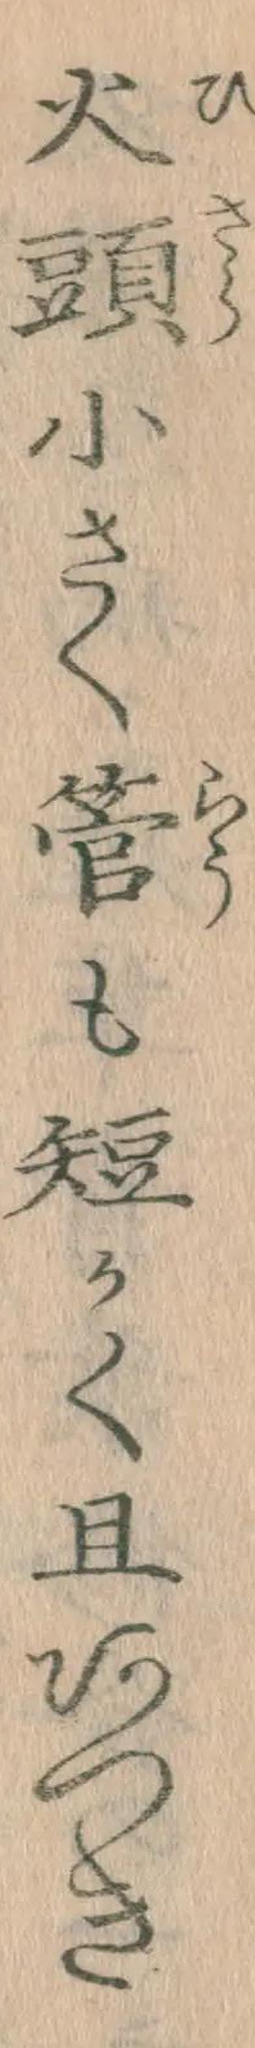火頭小さく管も短かく且あつき
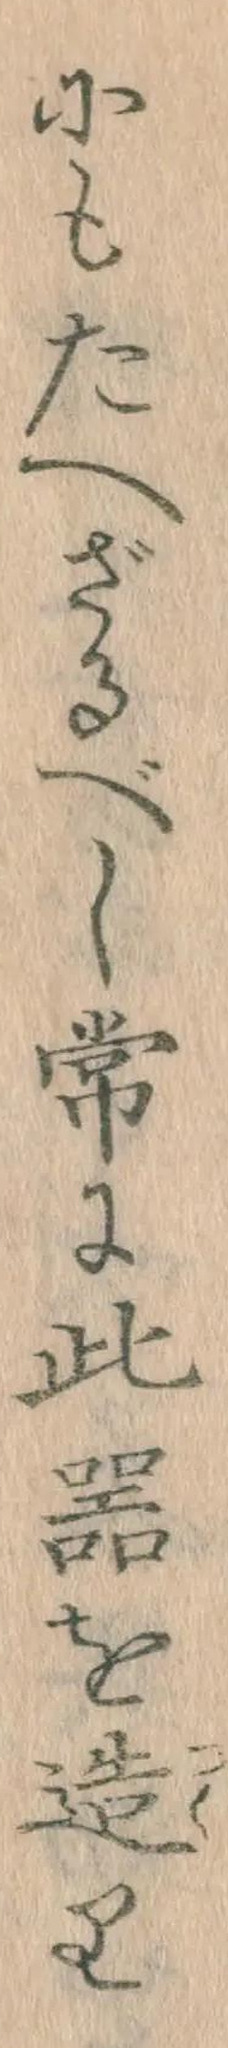にもたへざるべし常に此器を造り
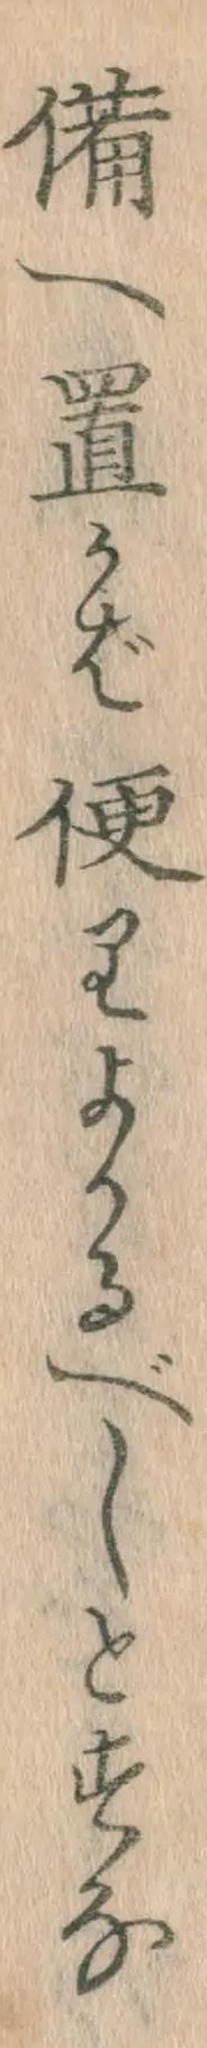備へ置かば便りよかるべしとすな
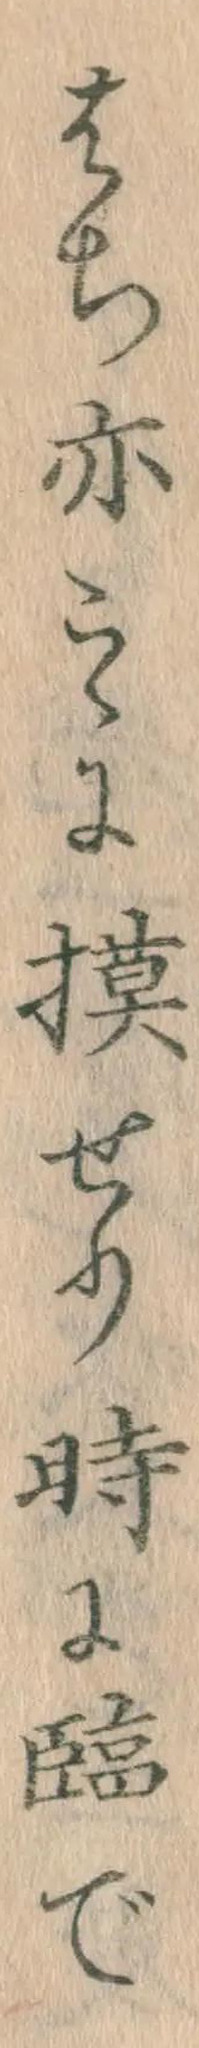はち亦こゝに摸せり時に臨で
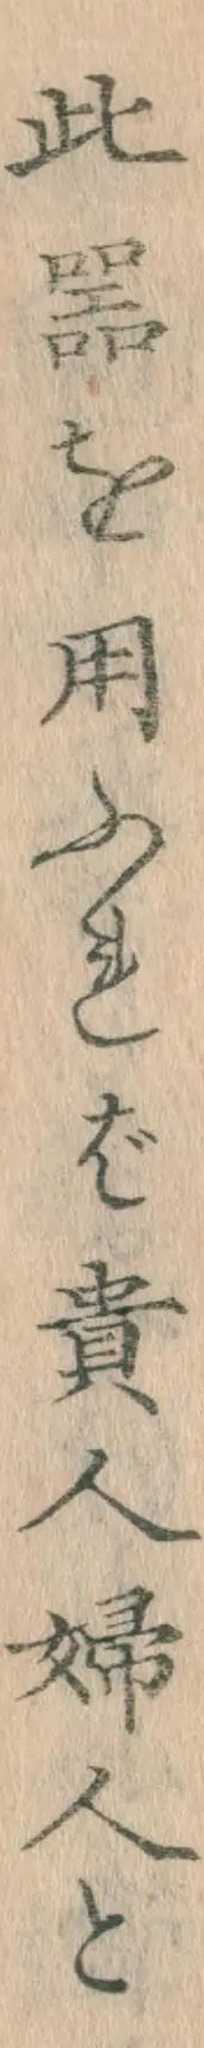此器を用ふれば貴人婦人と
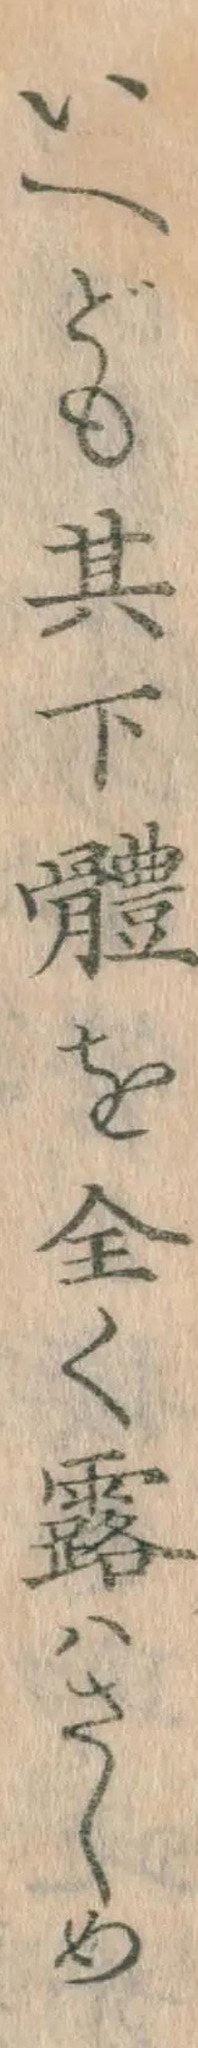いへども其下体を全く露はさしめ
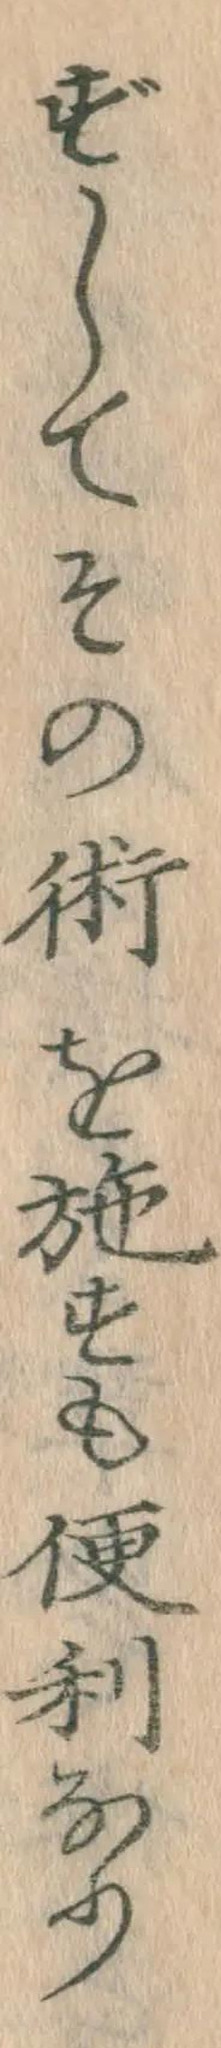ずしてその術を施すも便利なり
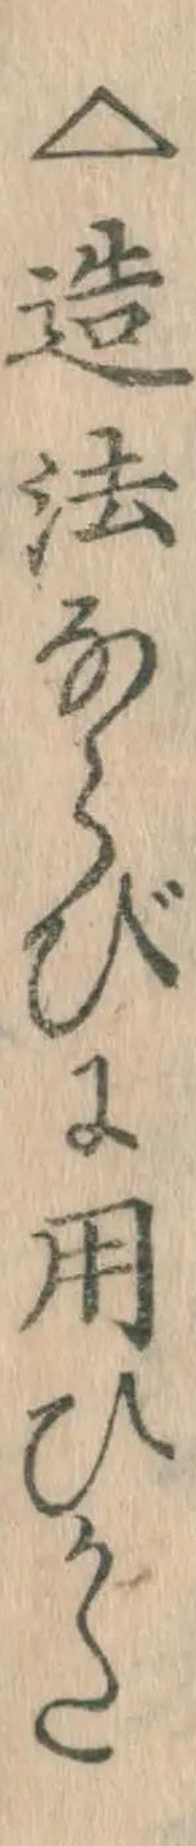△造法ならびに用ひかた

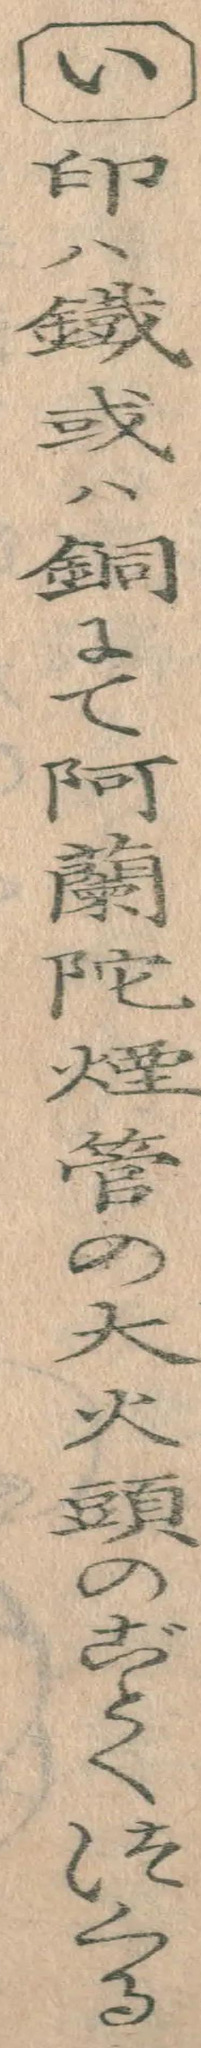「い」印は鉄或は銅にて阿蘭陀煙管の大火頭のごとくつくる
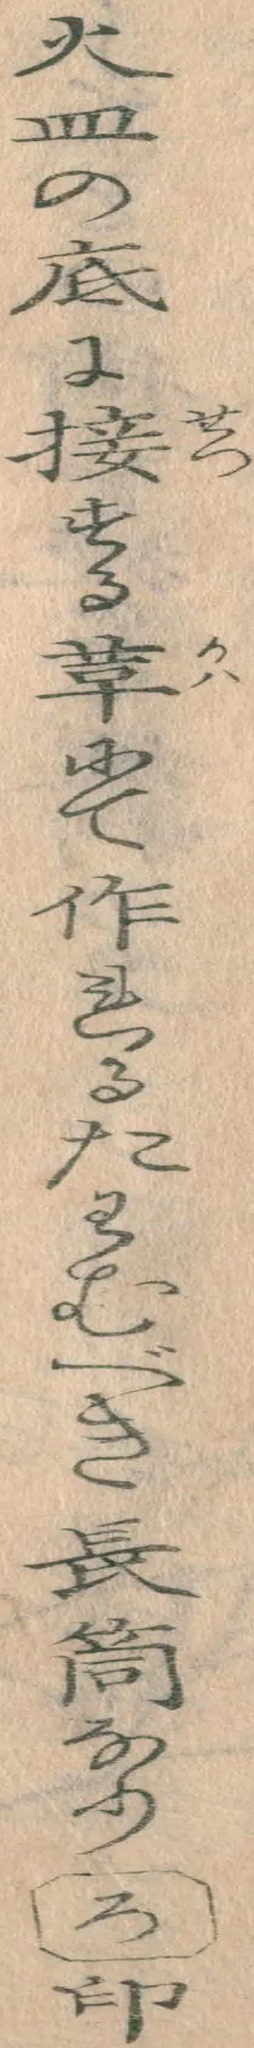火皿の底に接する革にて作れるたわむべき長筒なり「ろ」印
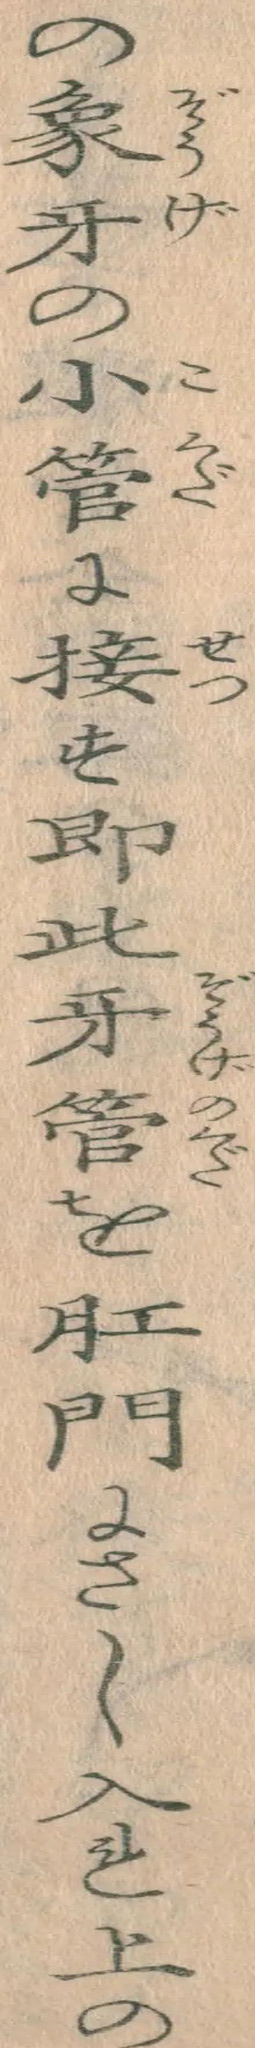の象牙の小管に接す即此牙管を肛門にさし入れ上の
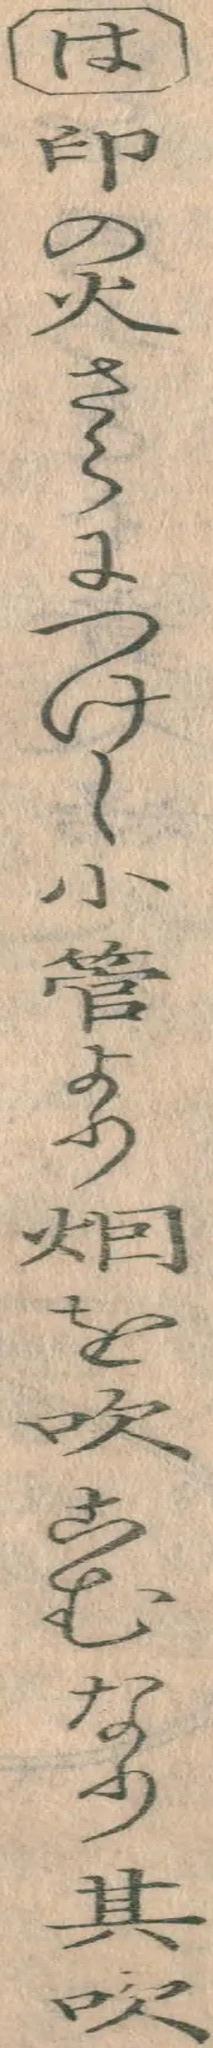「は」印の火さらにつけし小管より煙を吹こむなり其吹
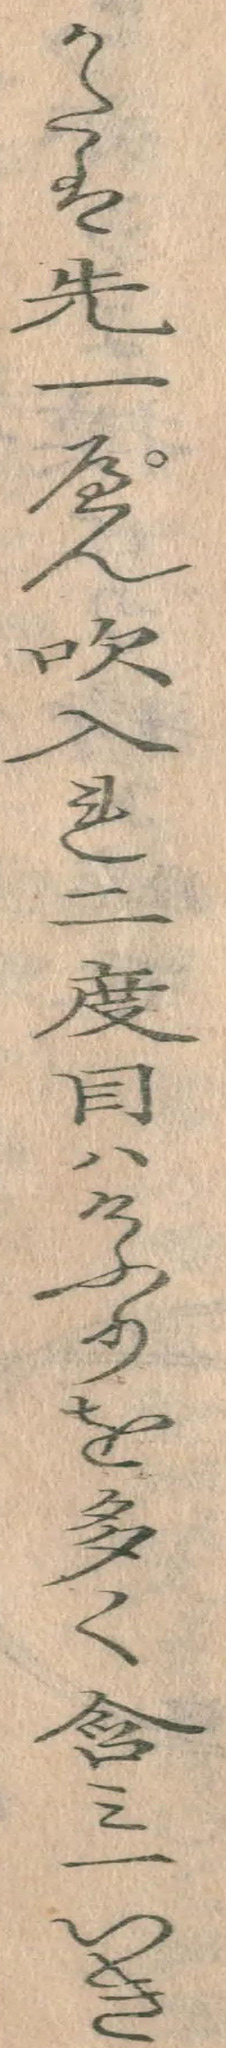かたは先一ぺん吹入れ二度目はけふりを多く含み一いき
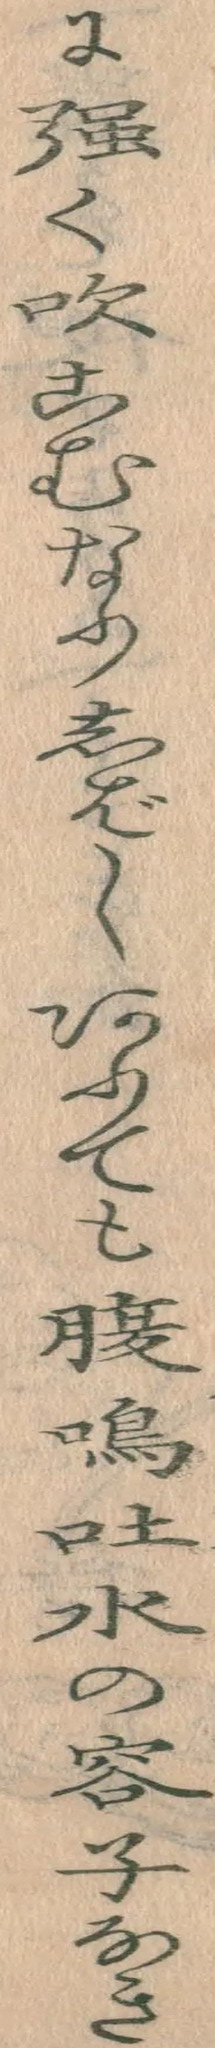に強く吹こむなりしばしありても腹鳴吐水の容子なき
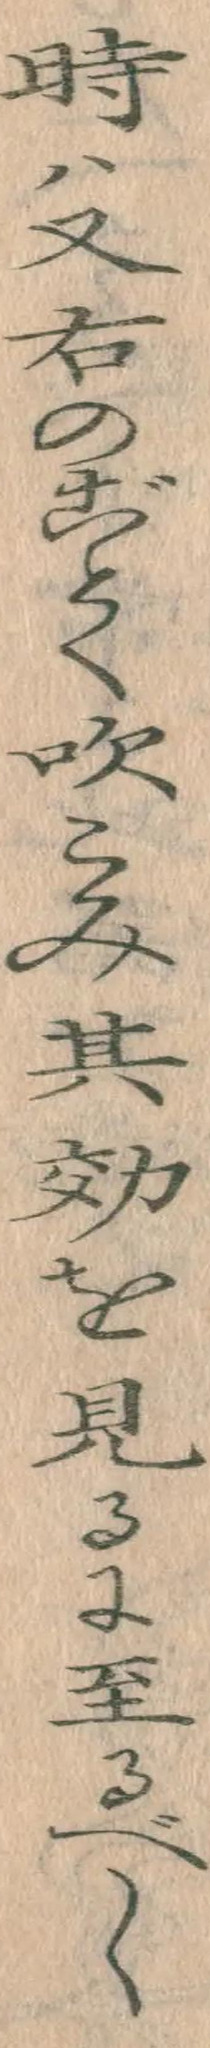時は又右のごとく吹こみ其効を見るに至るべし
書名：目さまし草
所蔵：国立国会図書館 National Diet Library, JAPAN
